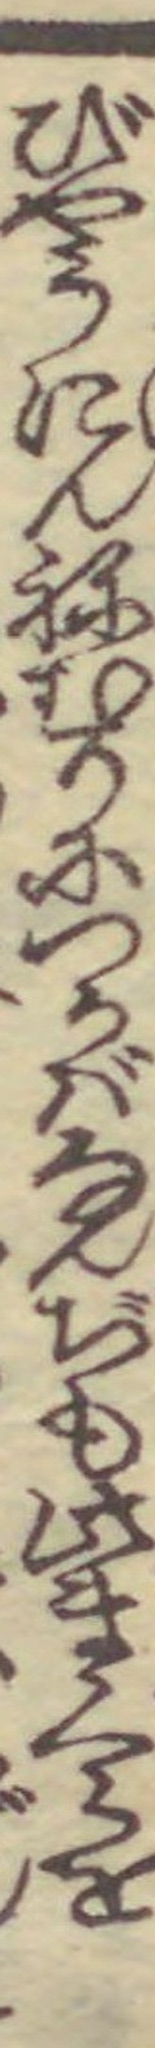びやうにんねむりにつかばなんぢも此まくらを
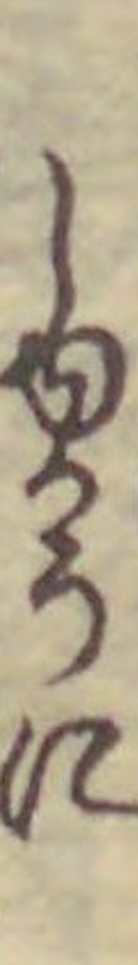しゆかうに
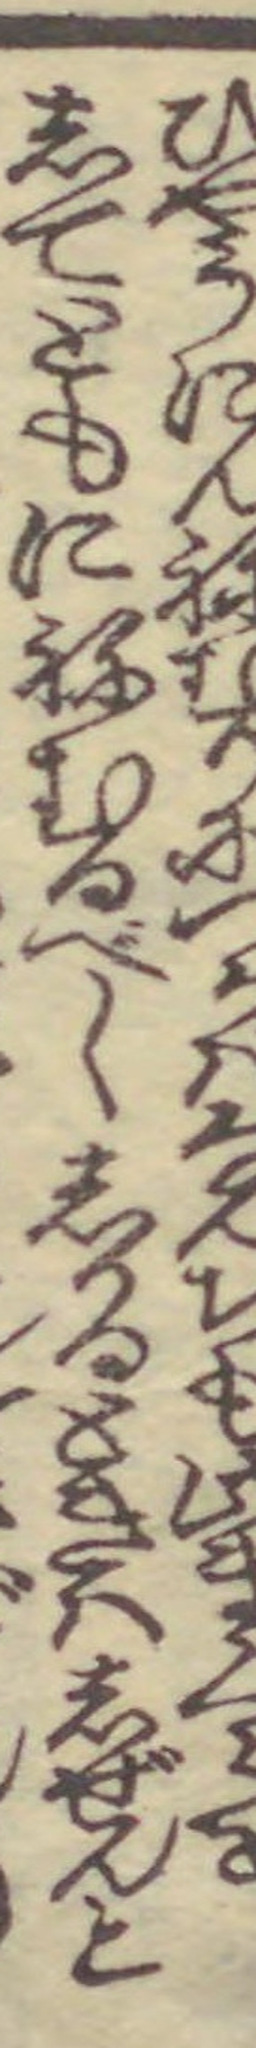してともにねむるべししかるときはしぜんと
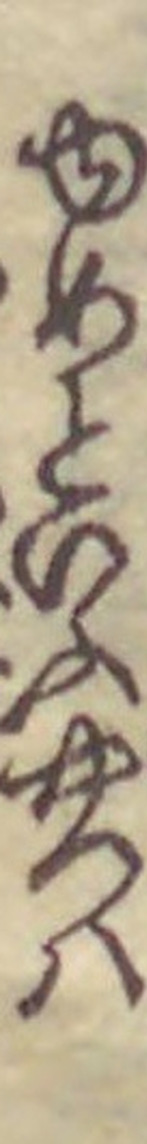ゆめといふやつは
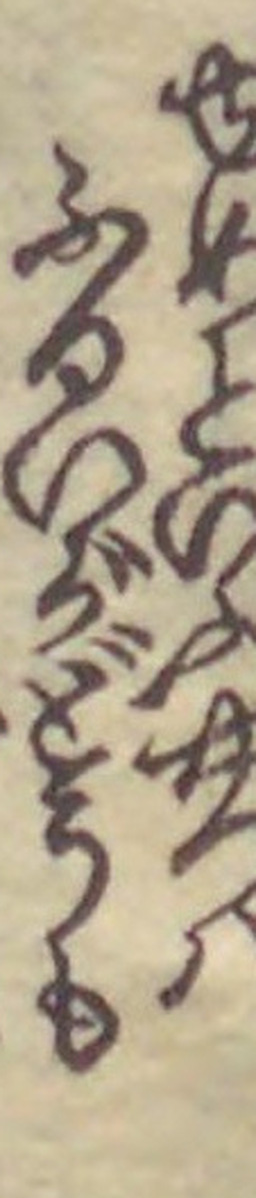ふるいがどうも
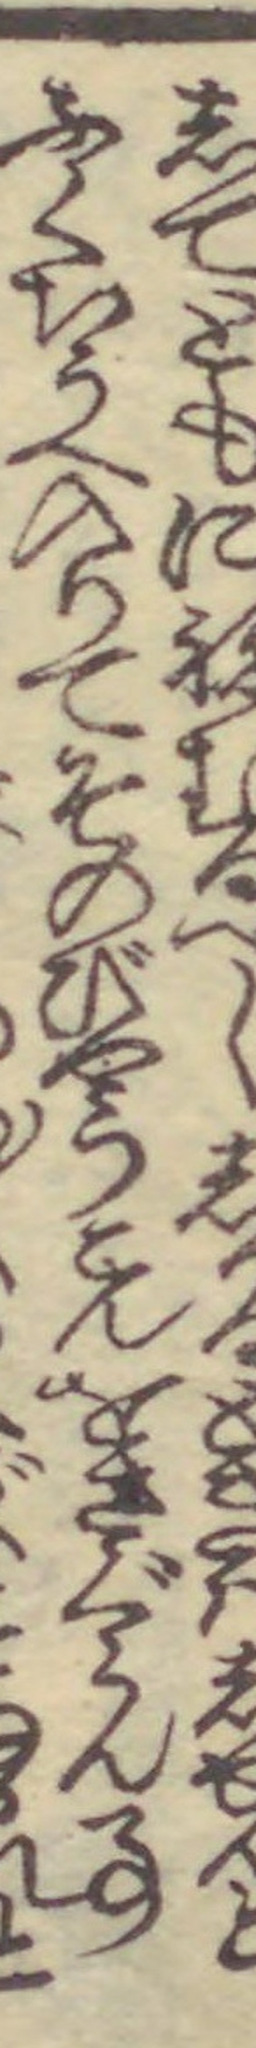ふくちうへ入りてそのびやうこんをさぐらん事
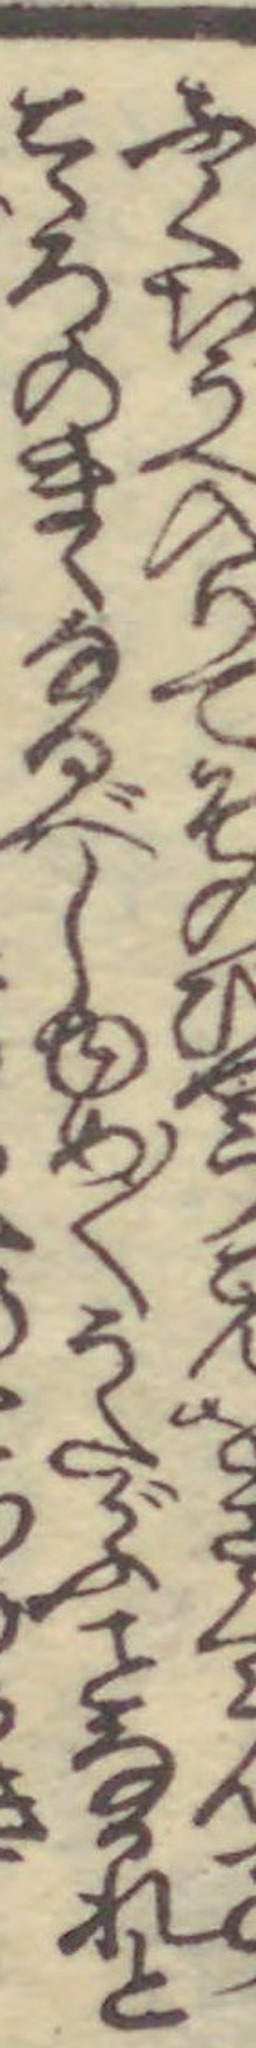こゝろのまゝなるべしゆめ〳〵うたがふことなかれと
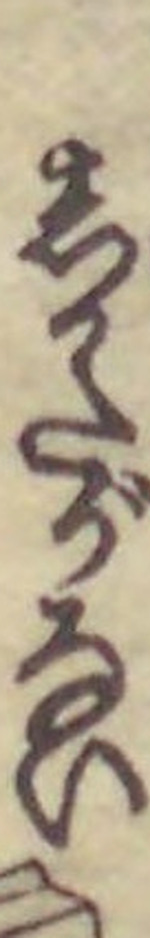しかたがない
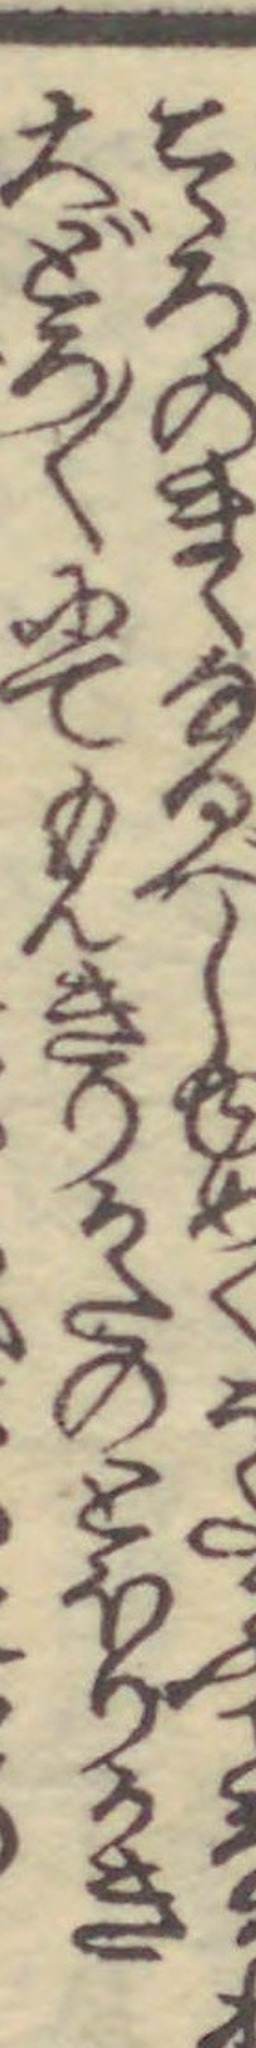大どろ〳〵にてもんきりかたのとほりかき
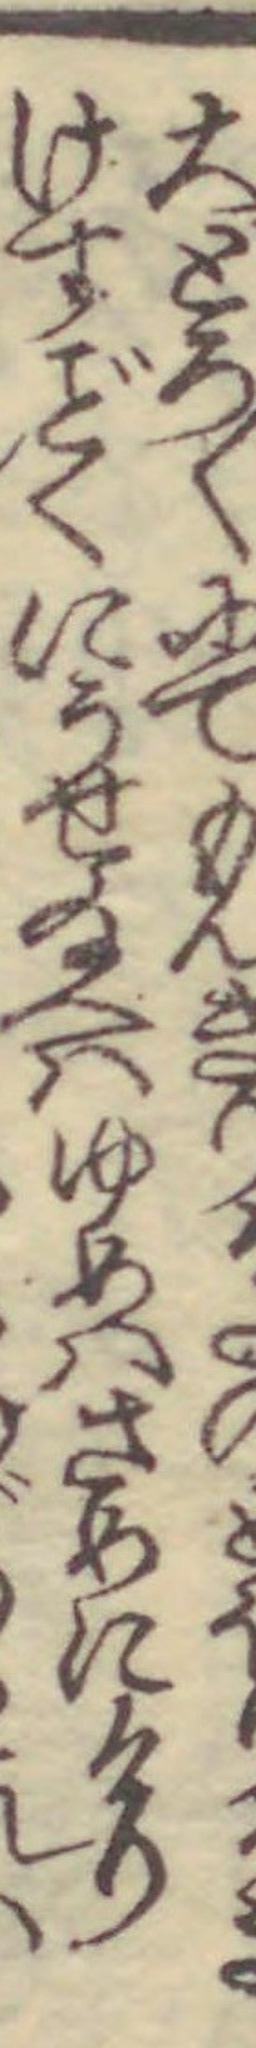けすごとくにうせ給へはゆめはさめにけり
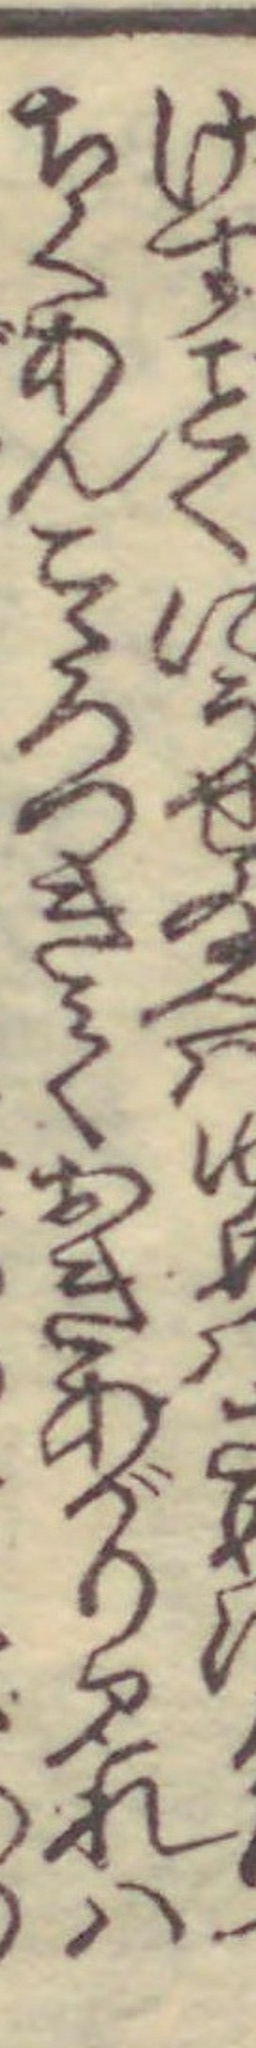ちくあんこゝろつきておきあがり見れは
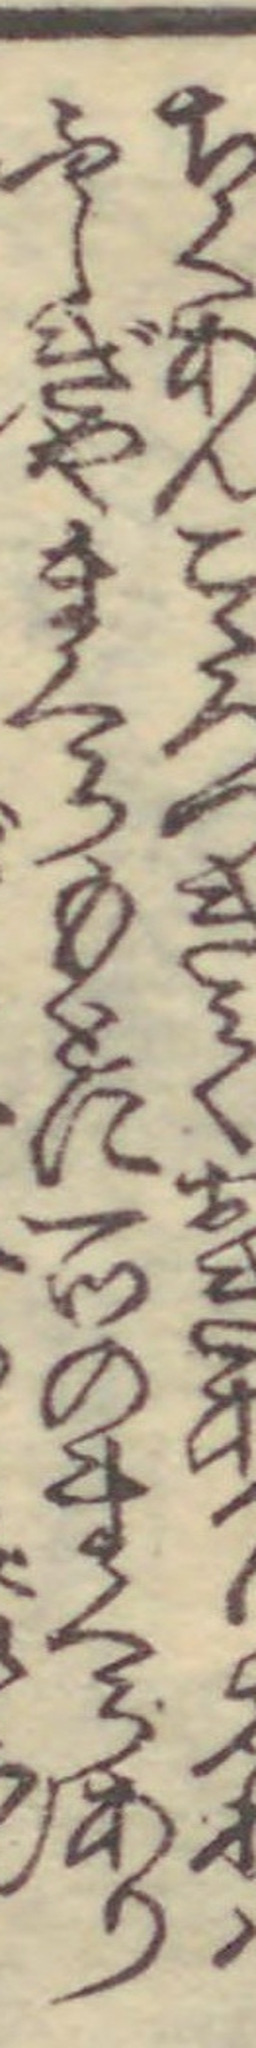ふしぎやまくらもとに一ッのまくらあり
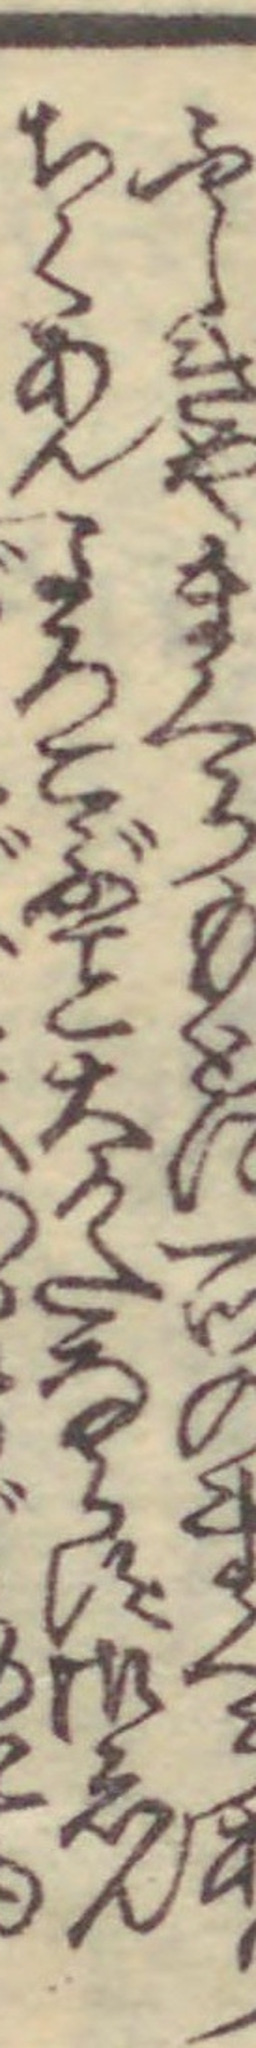ちくあんよろこぶこと大かたならす御しん
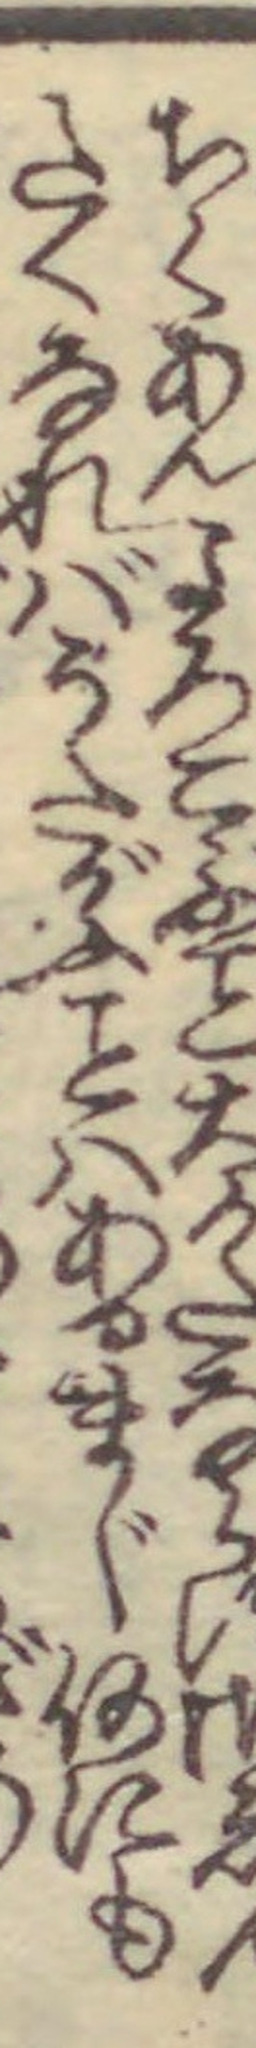たくなればうたがふことはあるまじ何にも
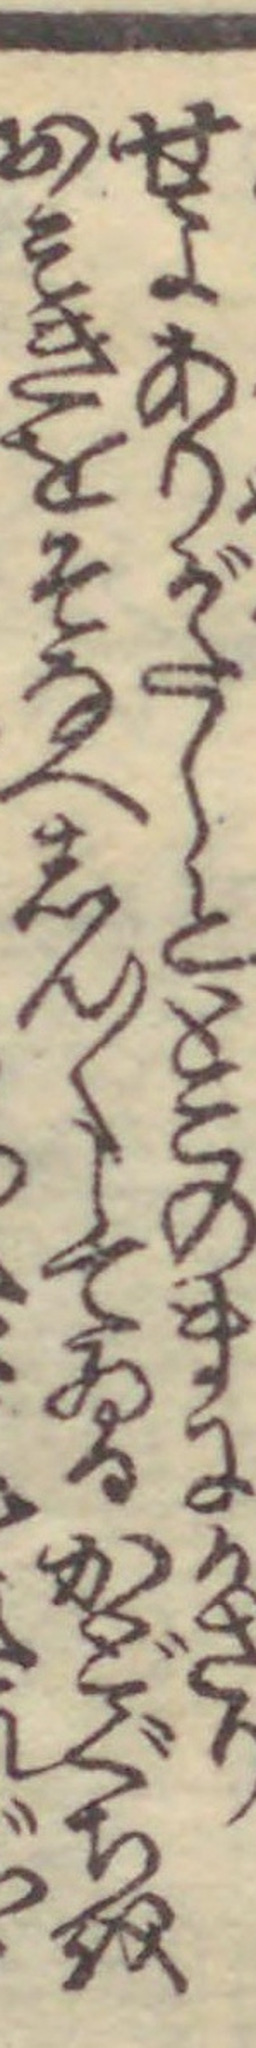おみきをそなへしん〳〵してゐるかどぐちを
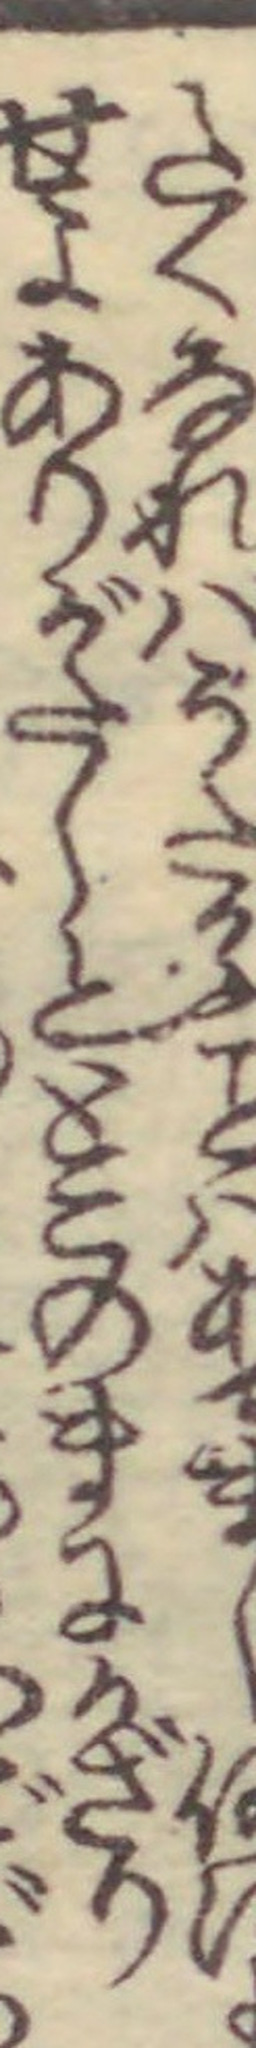せよありがたしととこのまにかざり
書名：腹内窺機関 2巻
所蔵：国立国会図書館 National Diet Library, JAPAN
